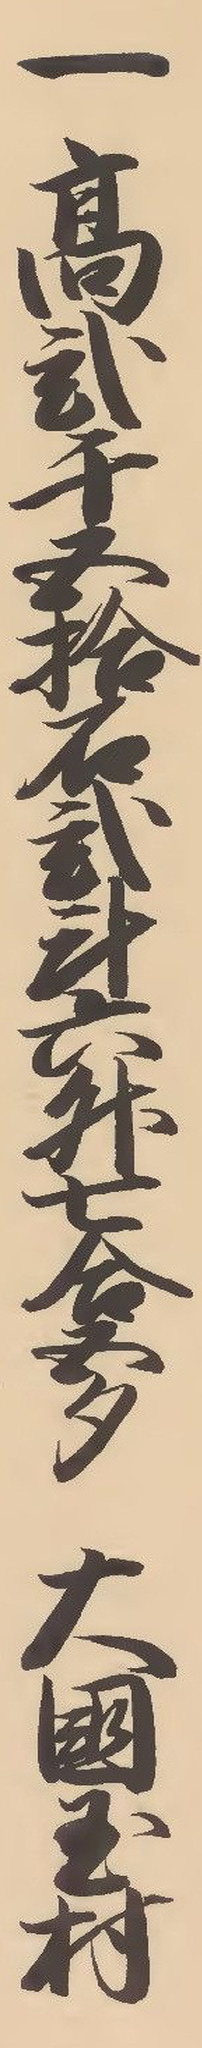一高弐千五拾石弐斗六升七合五勺大国玉村
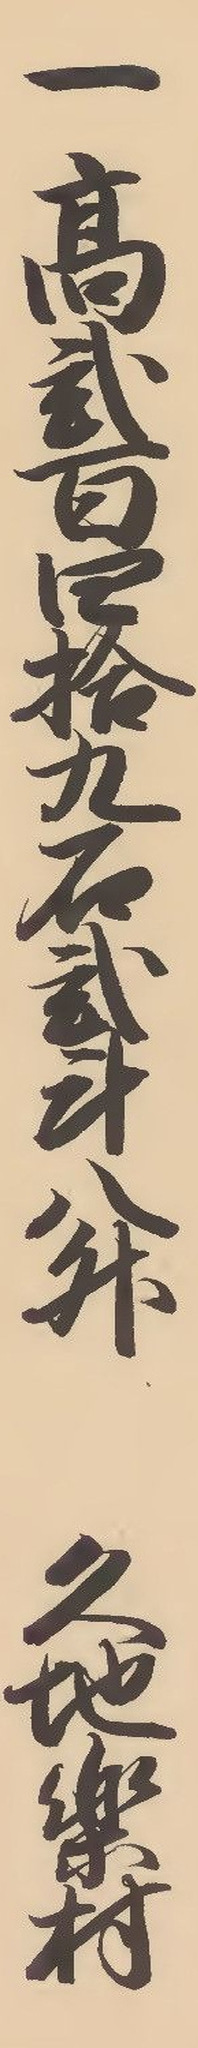一高弐百四拾九石弐斗八升久地楽村

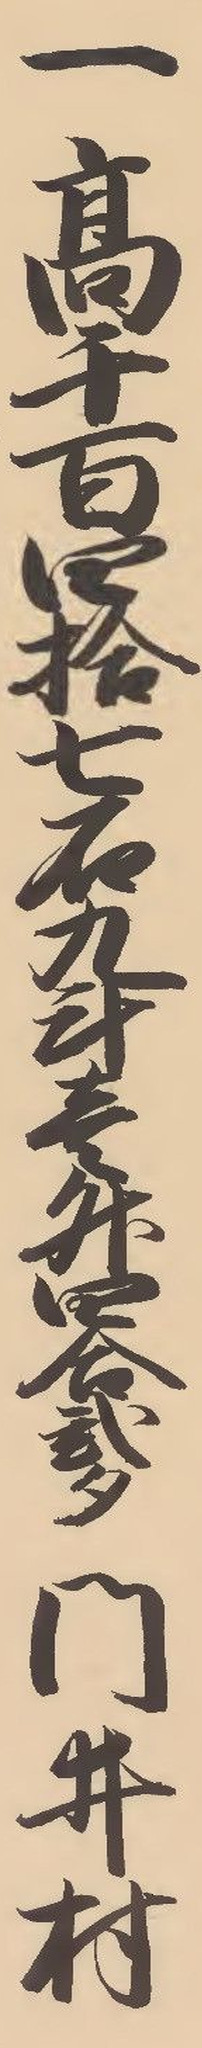一高千百四拾七石九斗壱升四合弐勺門井村
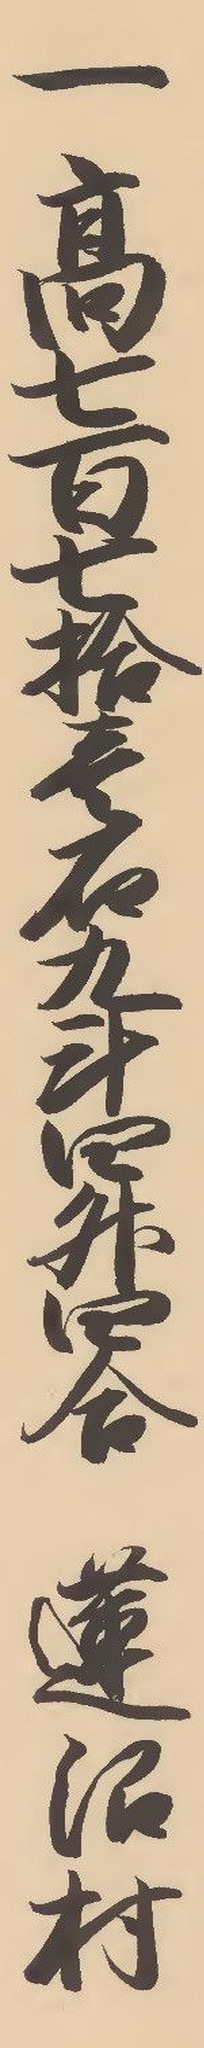一高七百七拾壱石九斗四升四合蓮沼村
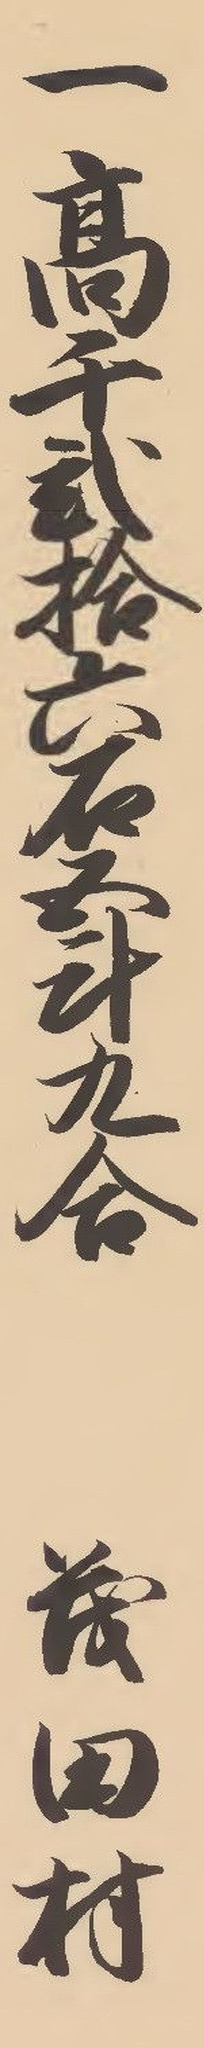一高千弐拾六石五斗九合茂田村
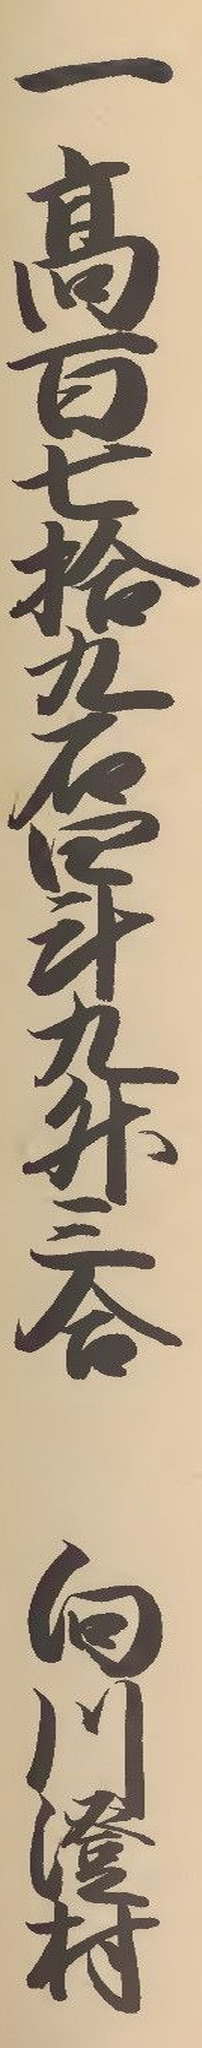一高百七拾九石四斗九升三合向川澄村
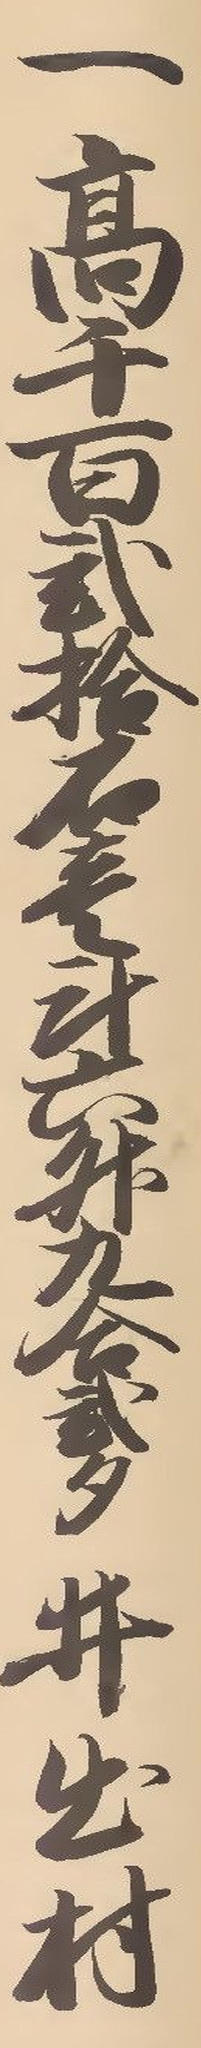一高千百弐拾石壱斗六升九合弐勺井出村
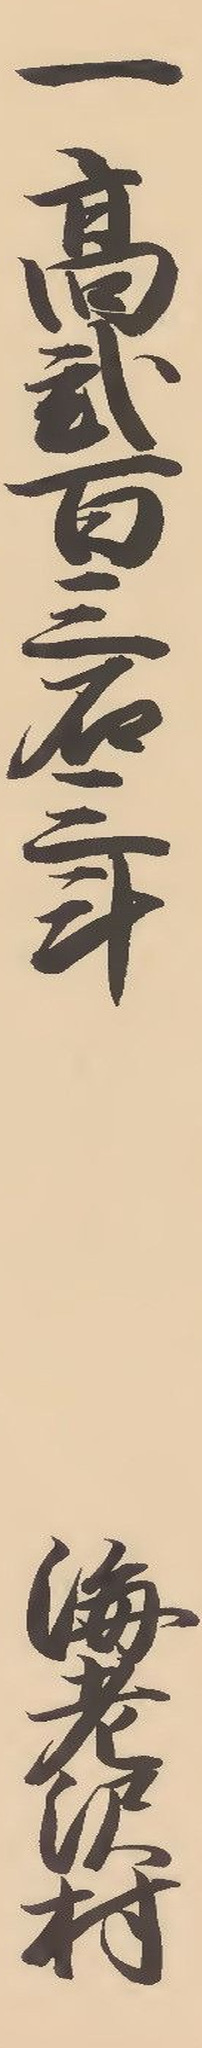一高弐百三石三斗海老沢村
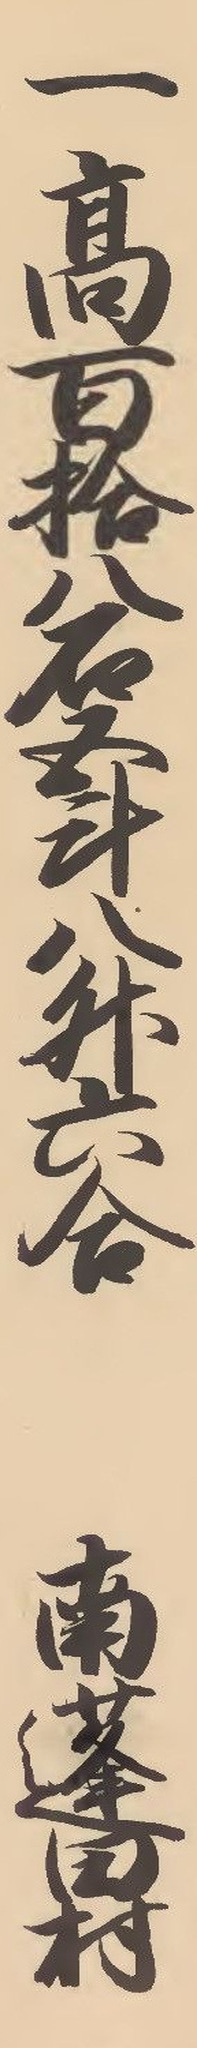一高百拾八石五斗八升六合南蓬田村
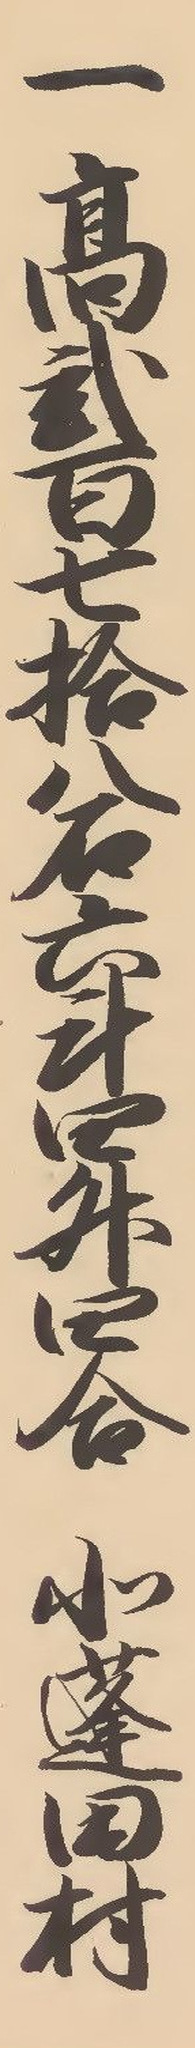一高弐百七拾八石六斗四升四合北蓬田村

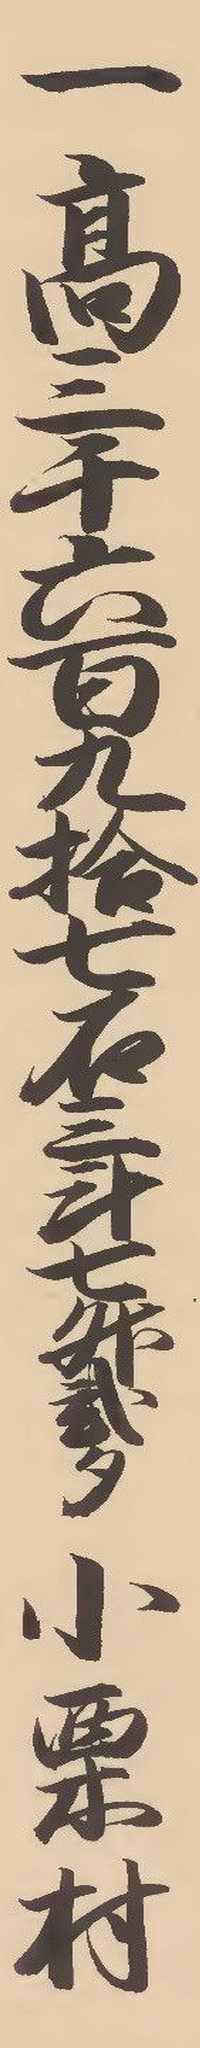一高三千六百九拾七石三斗七升弐勺小栗村
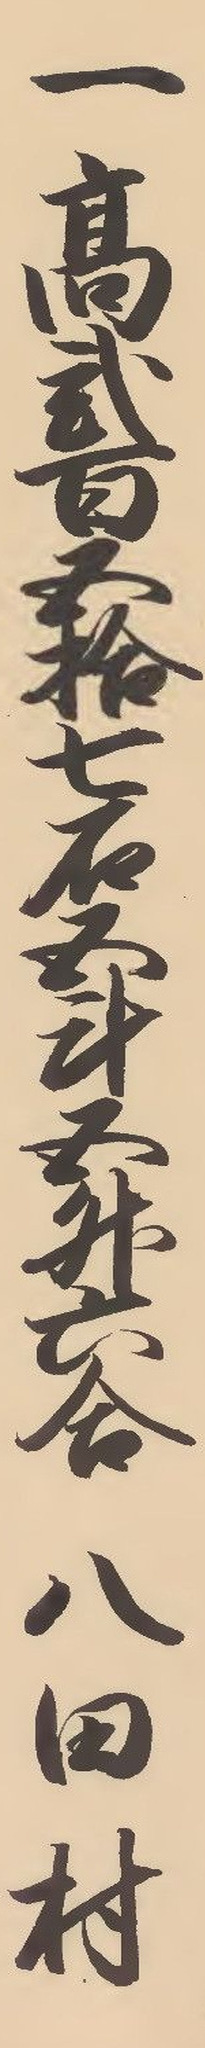一高弐百五拾七石五斗五升六合八田村
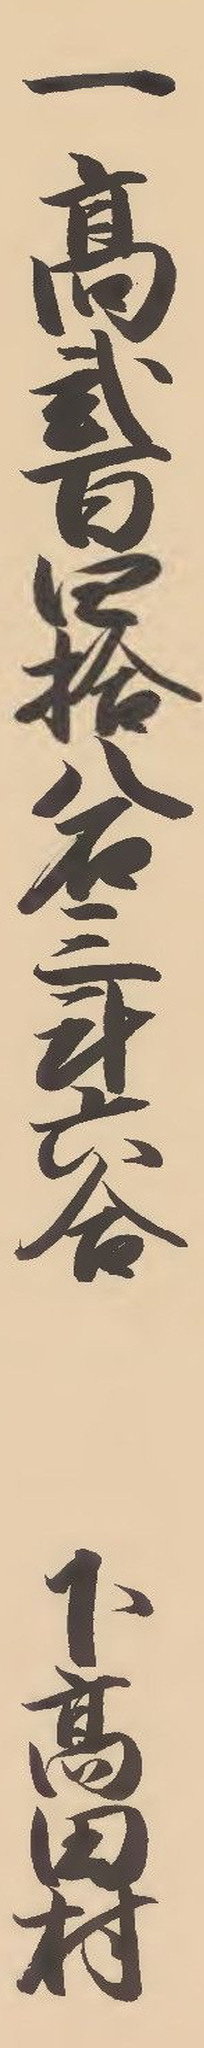一高弐百四拾八石三斗六合下高田村
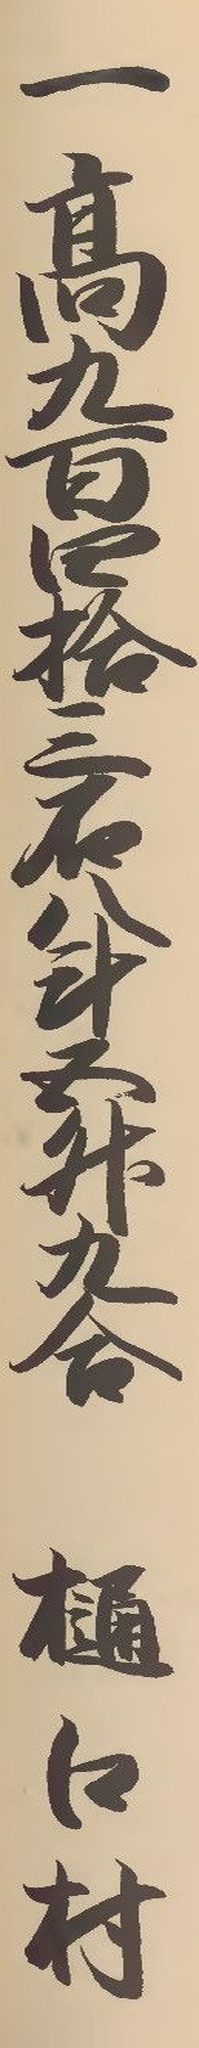一高九百四拾三石八斗五升九合樋口村
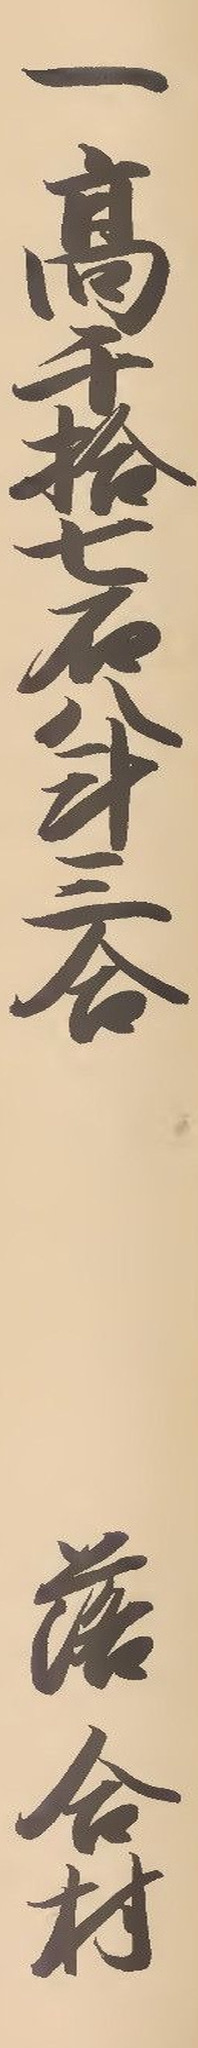一高千拾七石八斗三合落合村
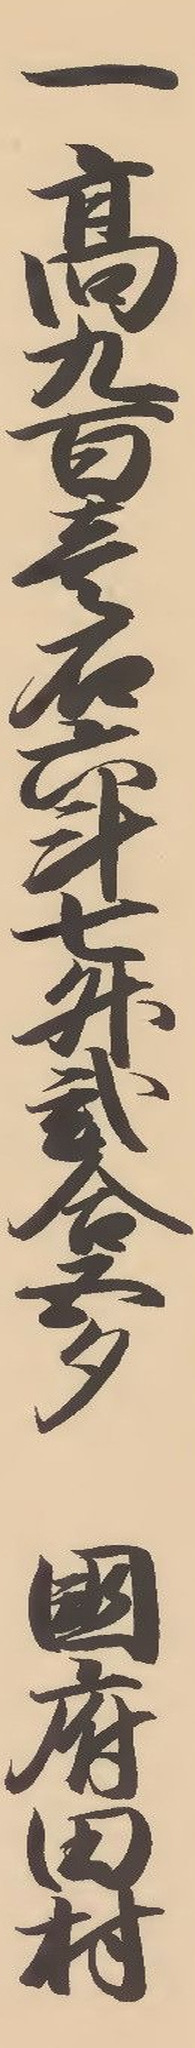一高九百壱石六斗七升弐合五勺国府田村
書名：常陸国郷帳
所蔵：国立公文書館 National Archives of Japan
